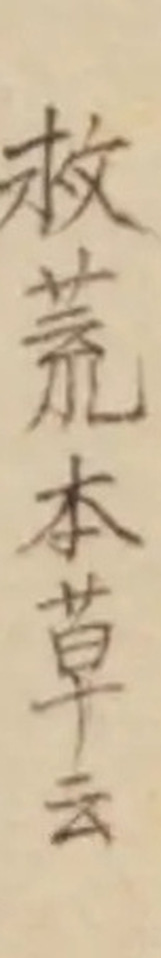救荒本草云
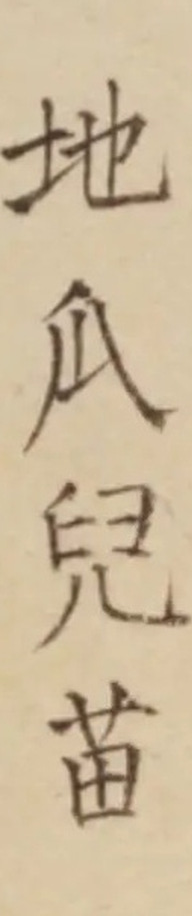地瓜兒苗

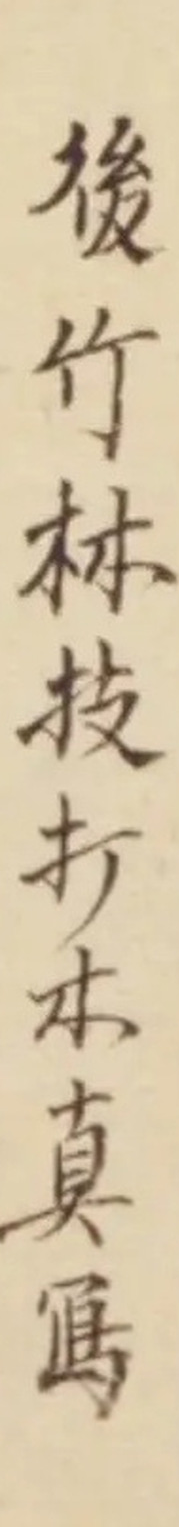後竹林枝打木真寫
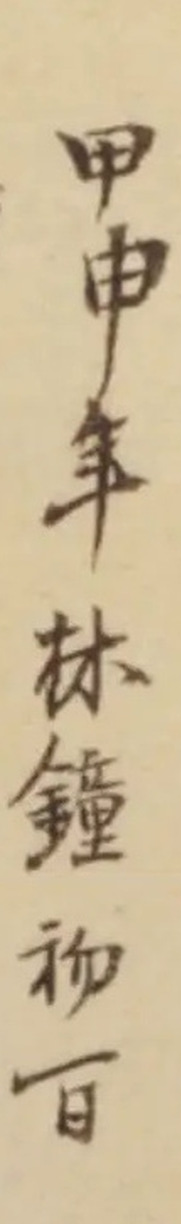甲申年林鐘初一日

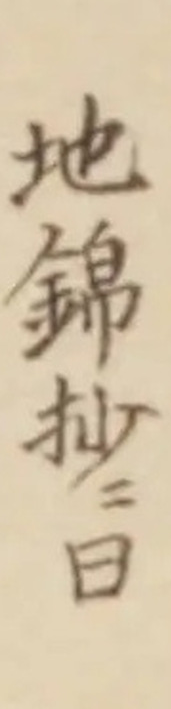地錦抄に曰
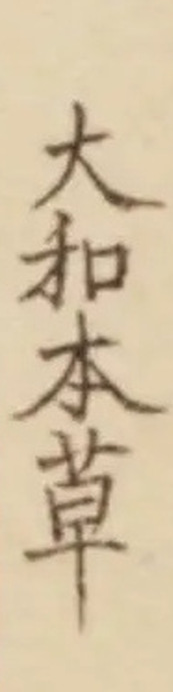大和本草
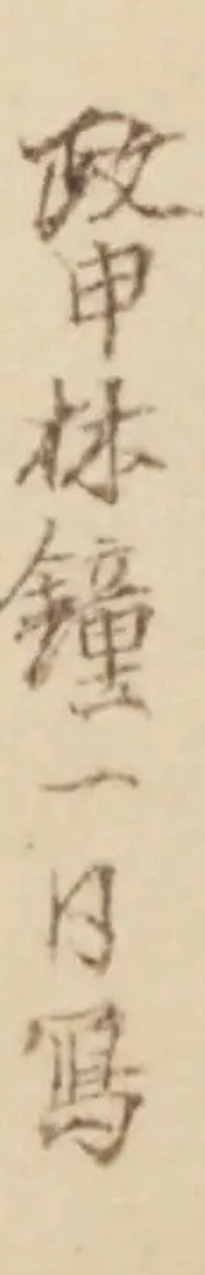政申林鐘一日寫
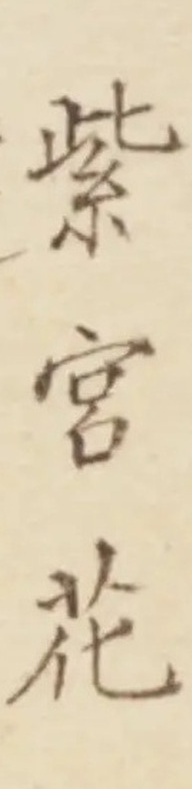紫宮花
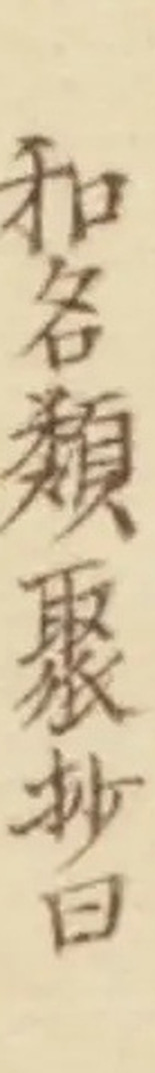和名類聚抄ニ曰
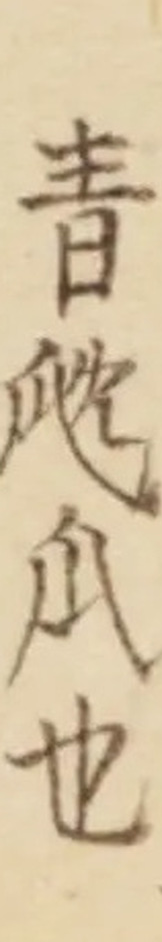青瓟瓜也
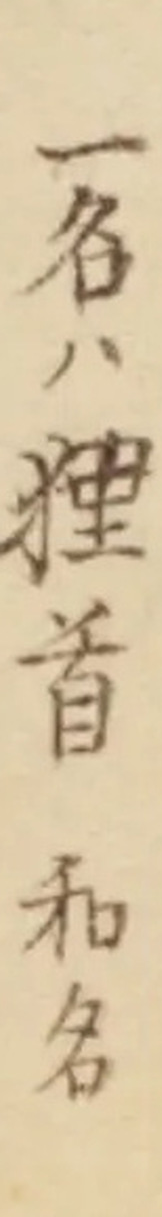一名は狸首和名
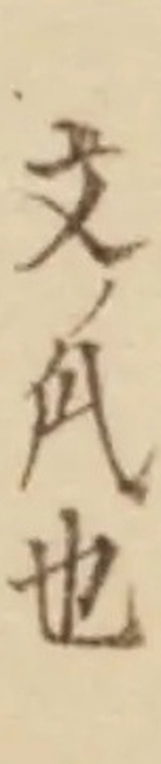文の瓜也
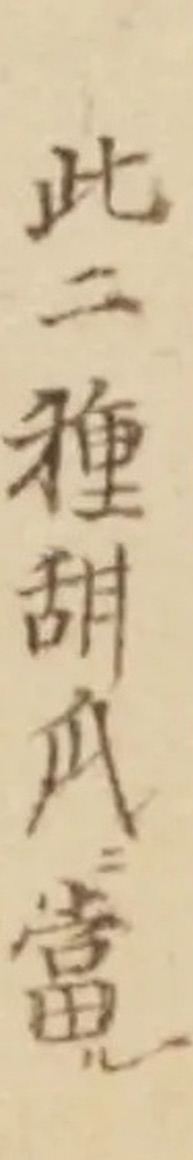此二種甜瓜に當る

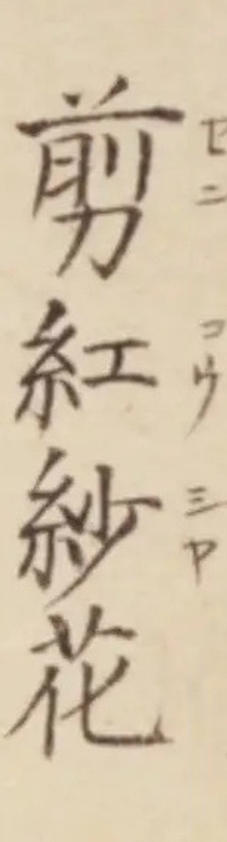剪紅沙花
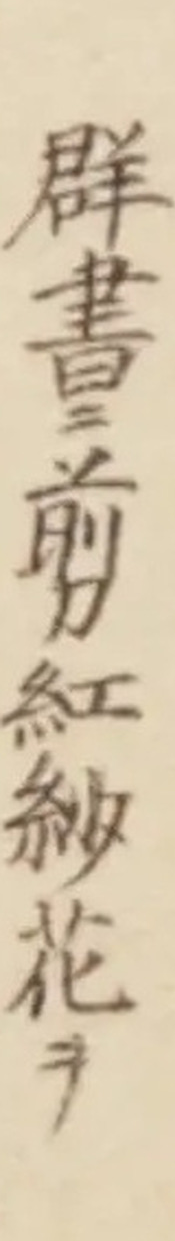群書に剪紅沙花を
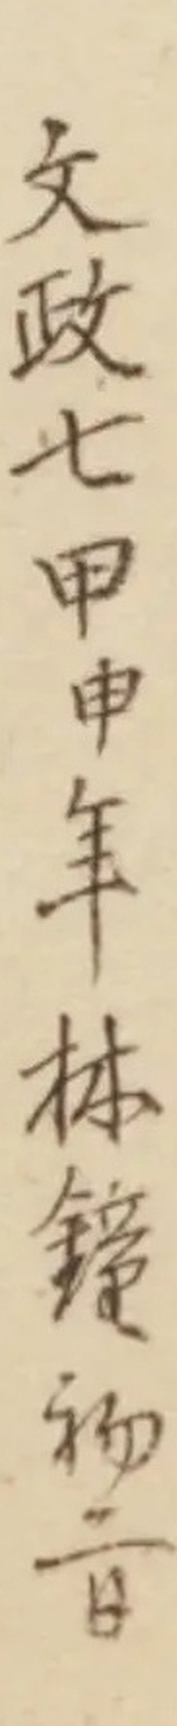文政七甲申年林鐘初二日
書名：梅園草木花譜夏之部. 2
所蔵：国立国会図書館 National Diet Library, JAPAN
